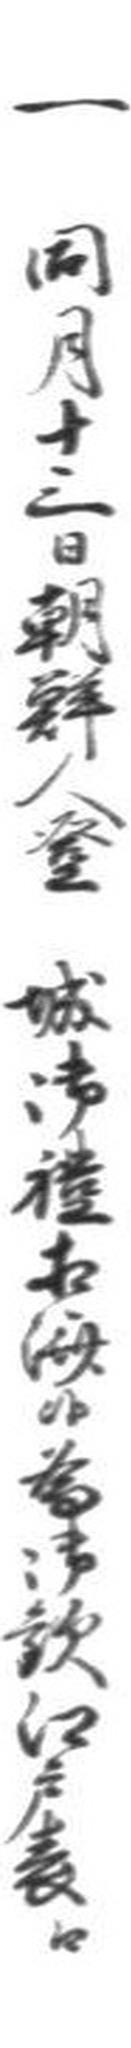一同月十三日朝鮮人登城御礼相済候為御歓江戸表江

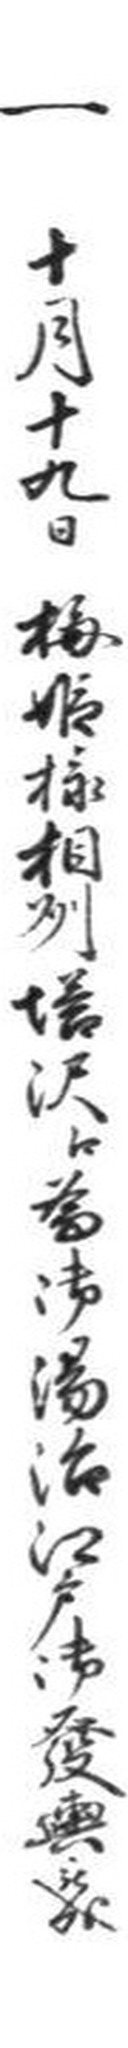一十月十九日梅姫様相州塔沢江為御湯治江戸御発輿被成
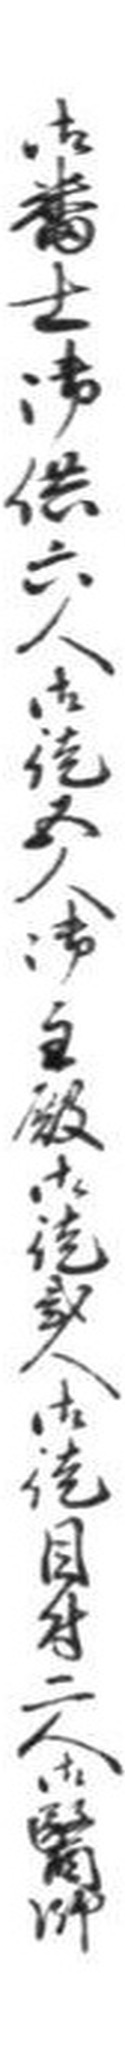御番士御供六人御徒五人主殿御徒弐人御徒目付二人御医師
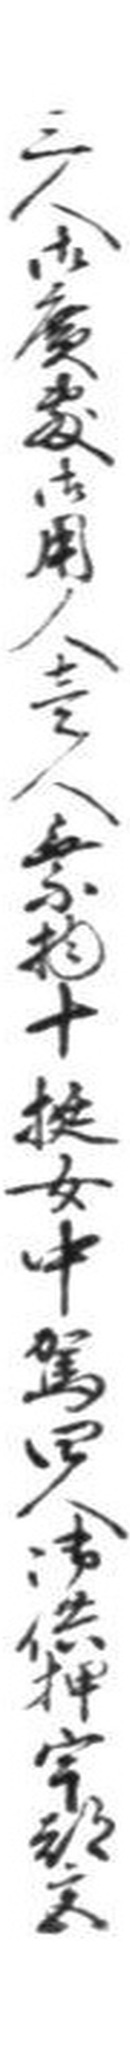三人御広敷御用人壱人乗物十挺女中駕四人御供押宇都宮
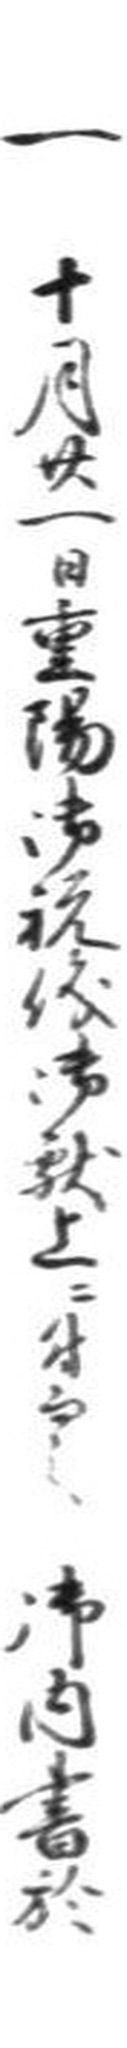一十月廿一日重陽御祝儀御献上ニ付而之御内書於
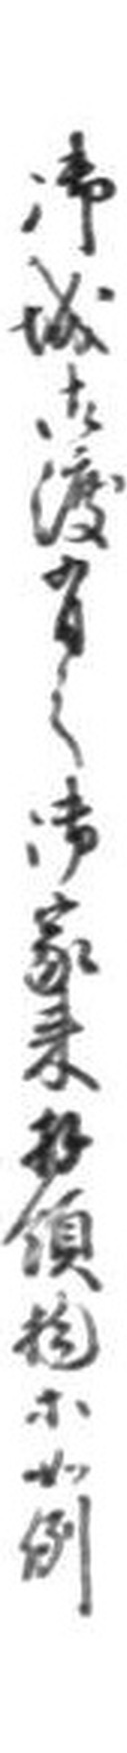御城御渡有之御家来拝領物等如例
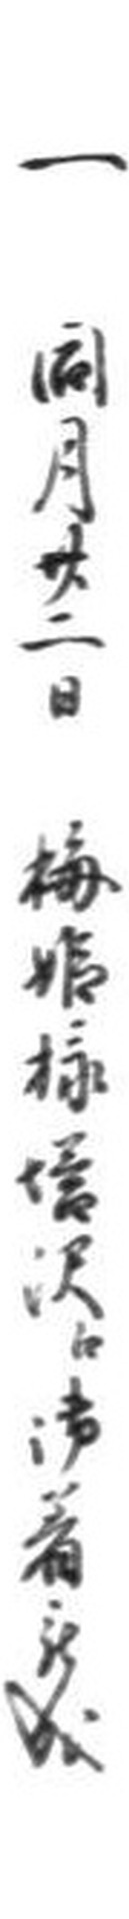一同月廿二日梅姫様塔沢江御着被成
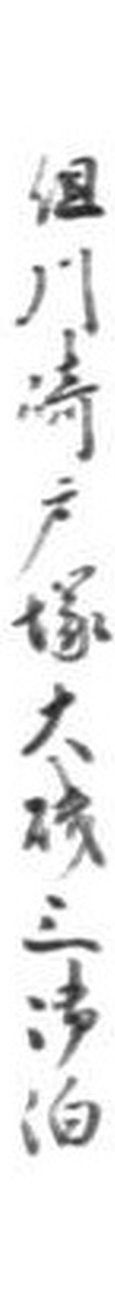但河崎戸塚大磯三御泊
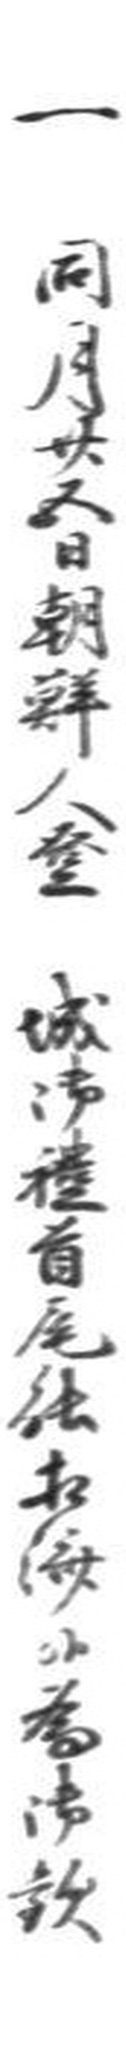一同月廿五日朝鮮人登城御礼首尾能相済候為御歓
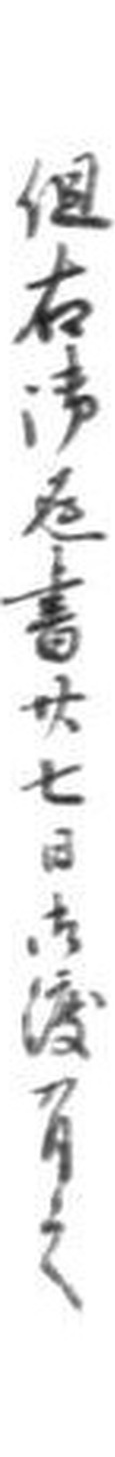但右御返書廿七日御渡有之

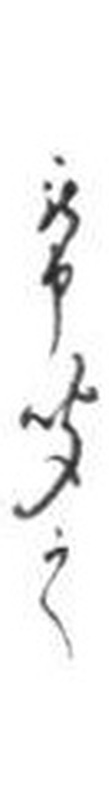被申聞之
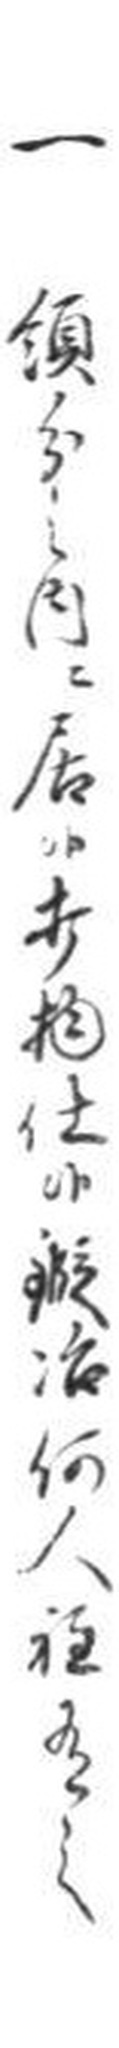一領分之内ニ居候打物仕候鍛冶何人程有之
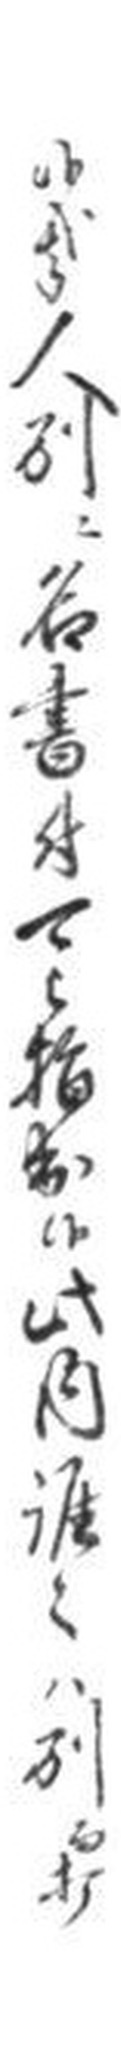候哉人別ニ名書付可被指出候此内誰々ハ別而打
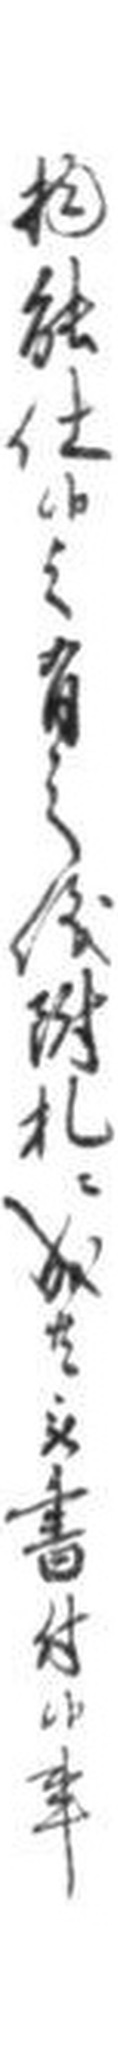物能仕候与有之儀付札ニ成共被書付候事
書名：家譜 三十三 吉邦公 享保四年
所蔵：福井県文書館 Fukui Prefectural Archives
